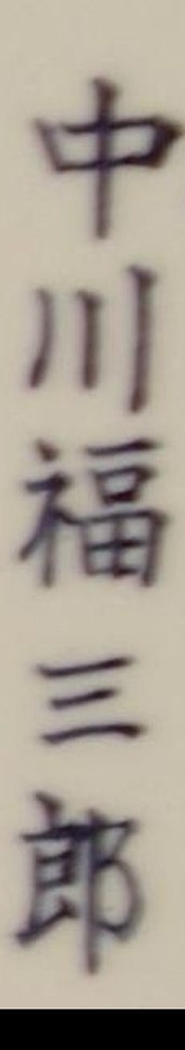中川福三郎
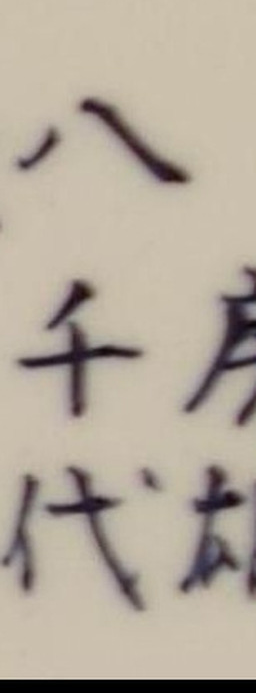八千代
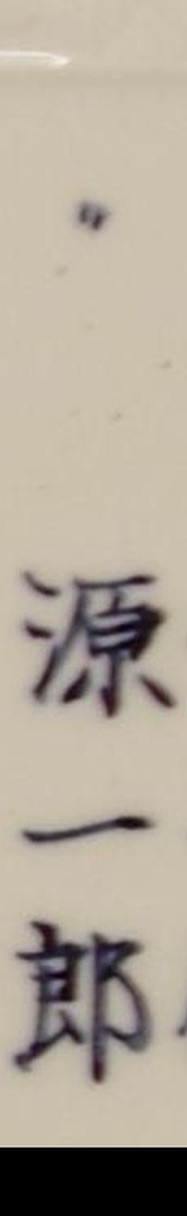源一郎
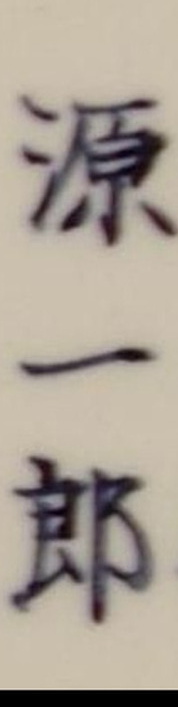源一郎
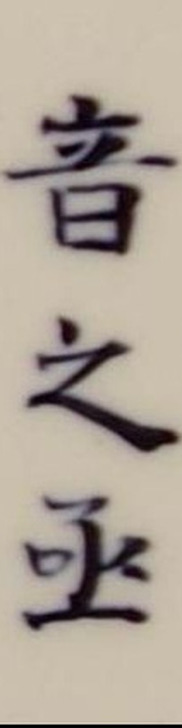音之丞
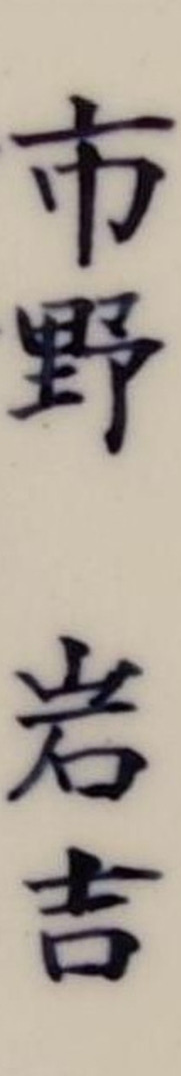市野岩吉
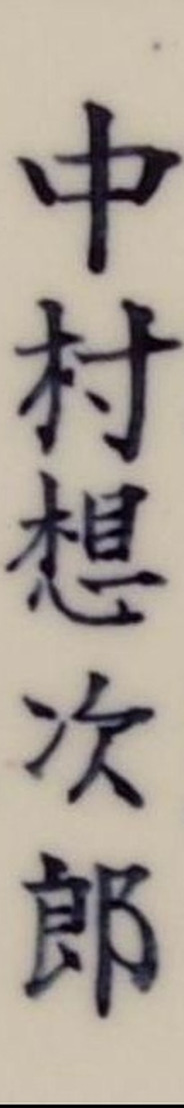中村想次郎
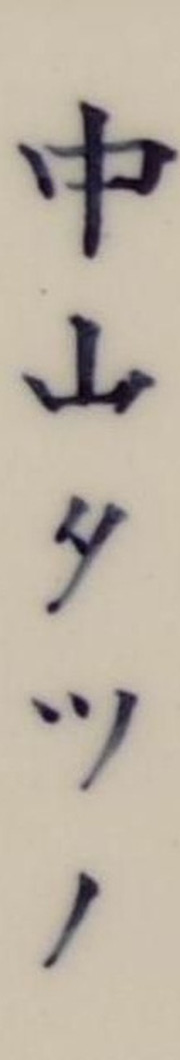中山タツノ
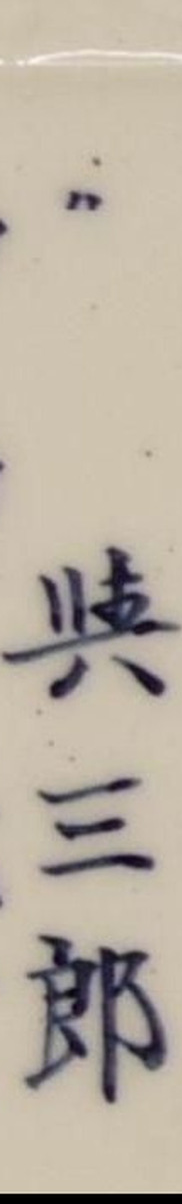與三郎
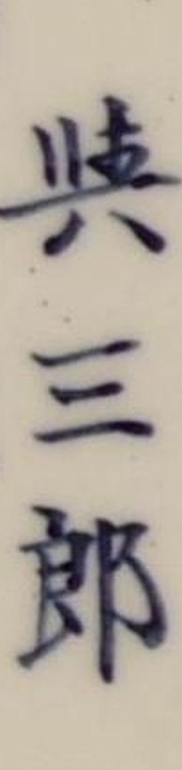與三郎
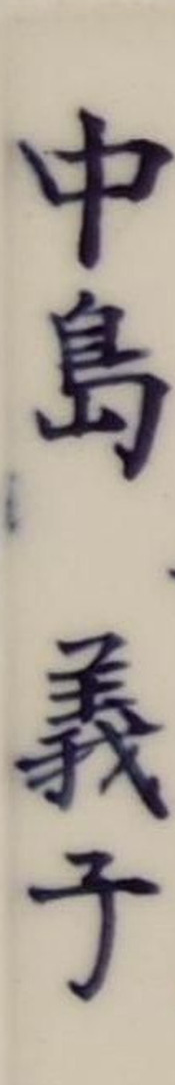中島義子

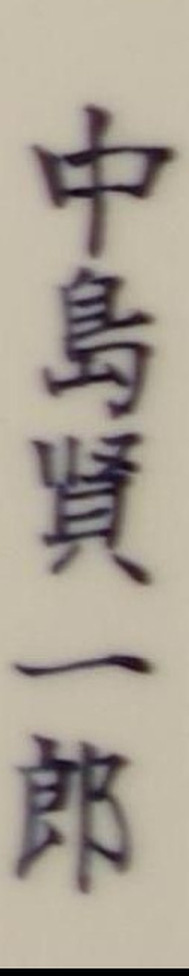中島賀一郎
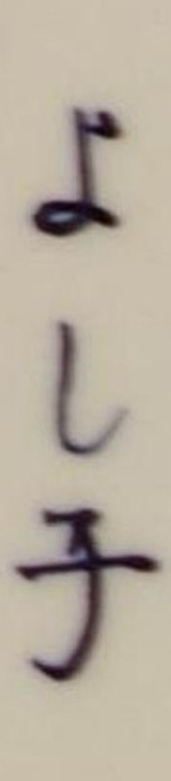よし子
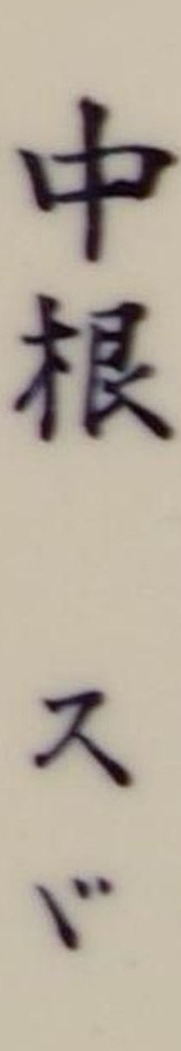中根スゞ
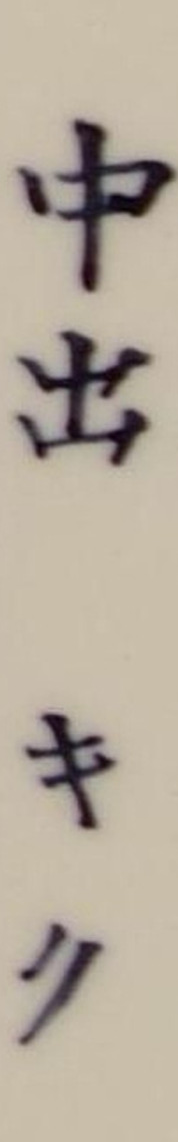中出キク
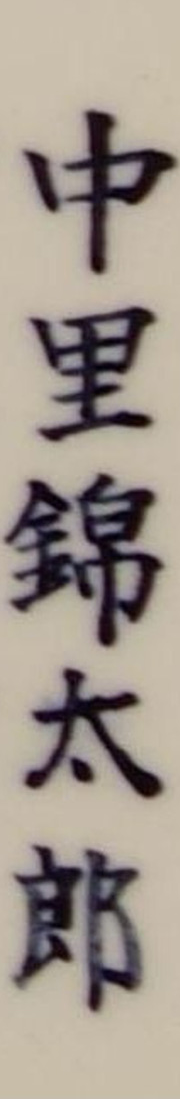中里錦太郎
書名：M~S
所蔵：高野山金剛峯寺
